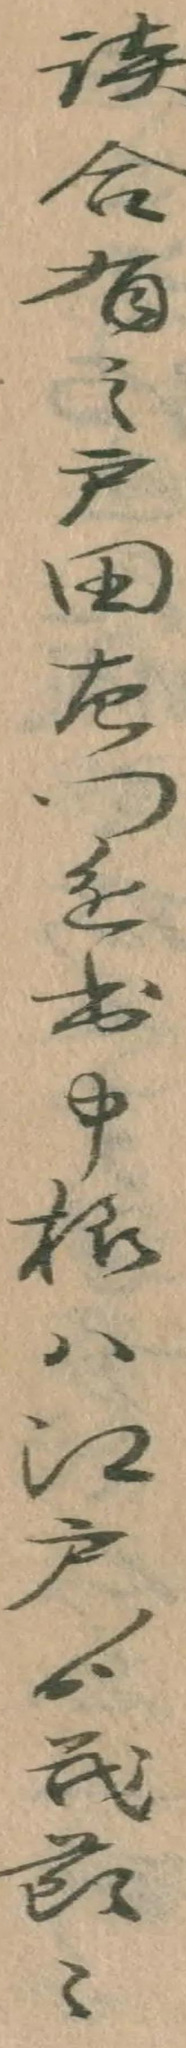談合有之戸田左門進出申様は江戸ゟ茂節々
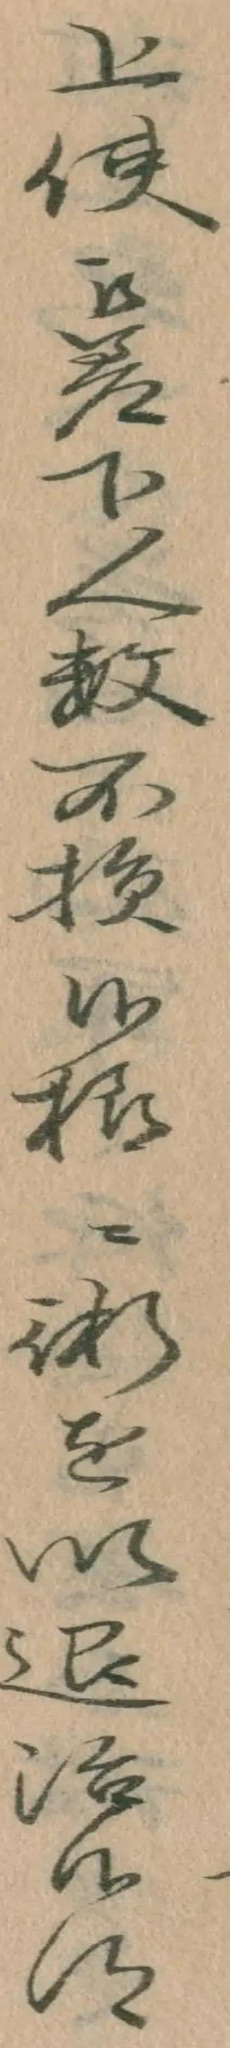上使被差下人数不損候様に漸を以退治候得
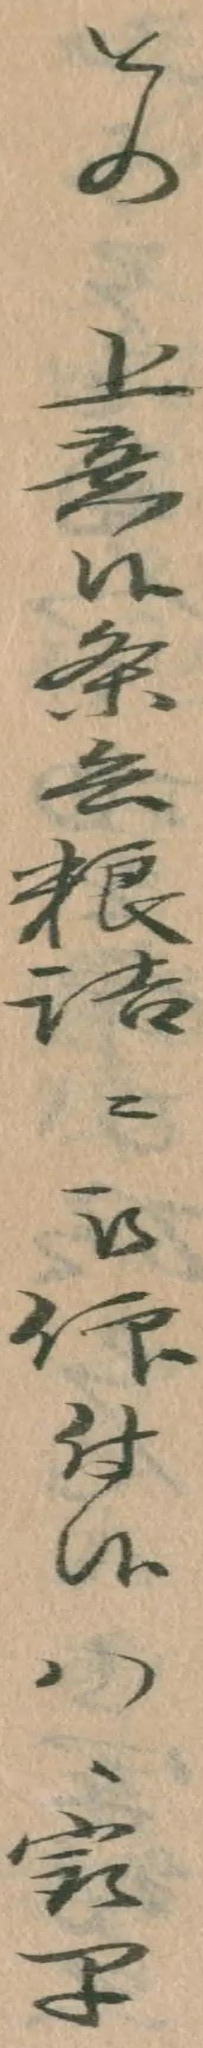との上意候条兵粮詰に被仰付候はゝ最早
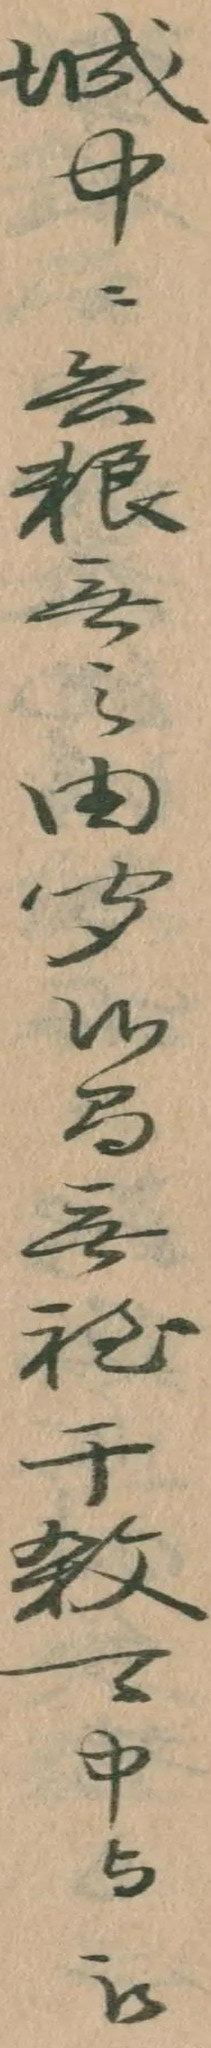城中に兵粮無之由聞候間無程干殺可申与被
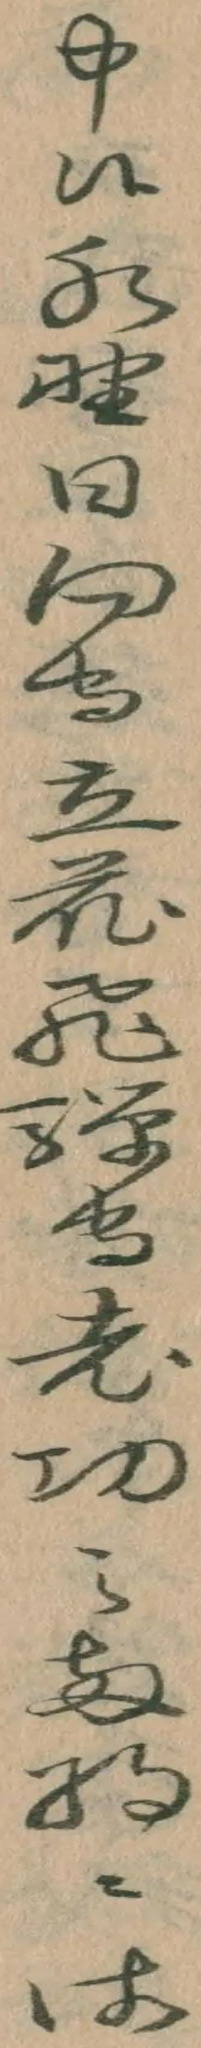申候水野日向守立花飛騨守老功之両将に御
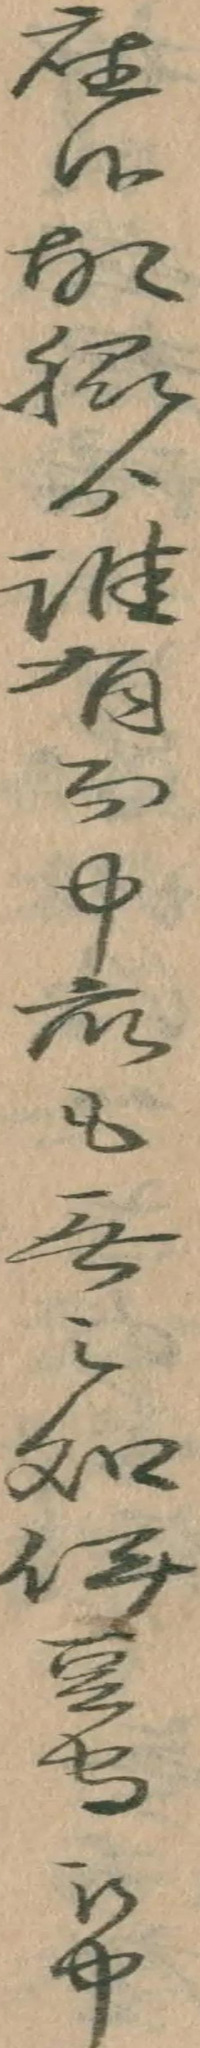座候故脇ゟ誰有而申衆も無之処伊豆守被申
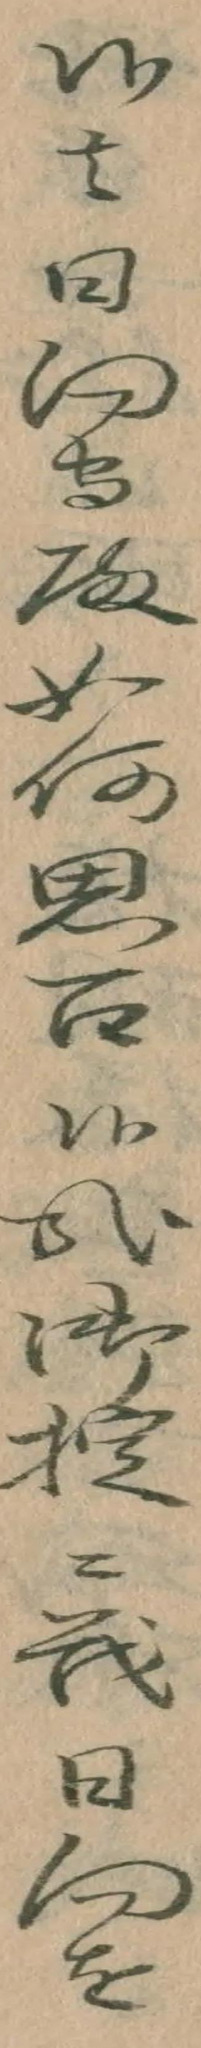候者日向守殿如何思召候哉御掟に茂日向を
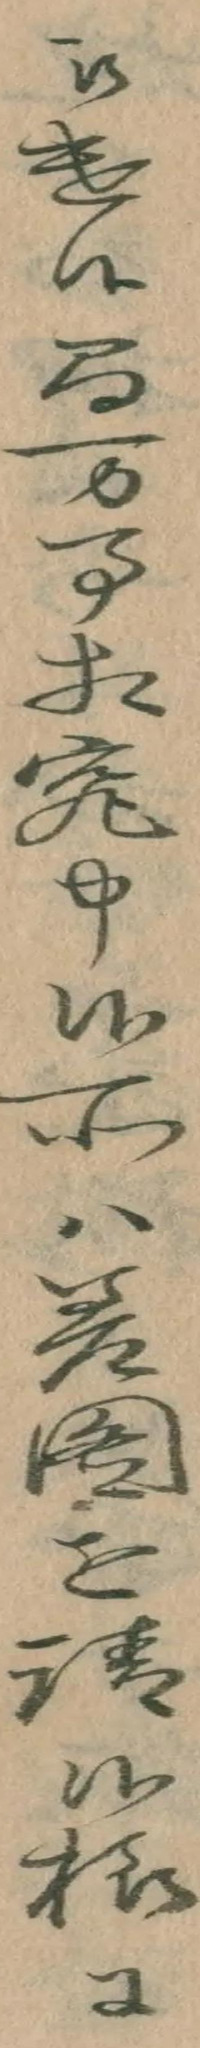被遣候間万事相究申候所は差図を請候様尓
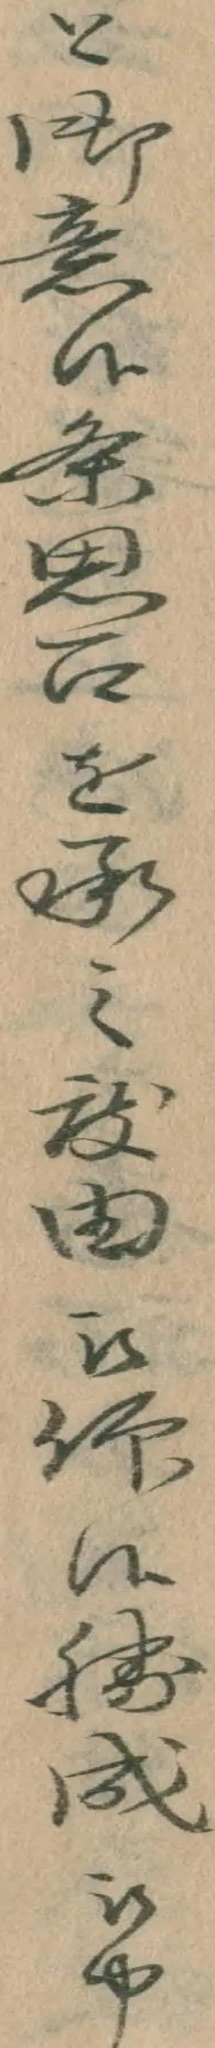と御意候条思召を承之度由被仰候勝成被申
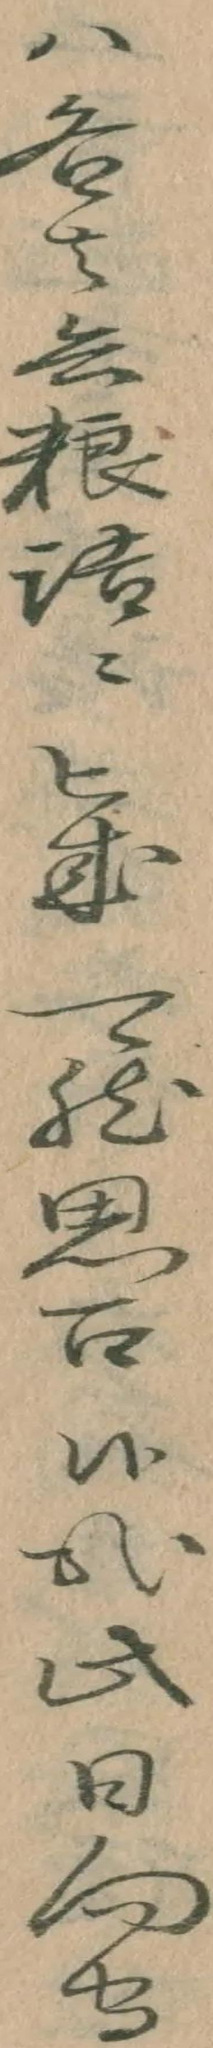は各者兵粮詰に被成可然思召候哉此日向守
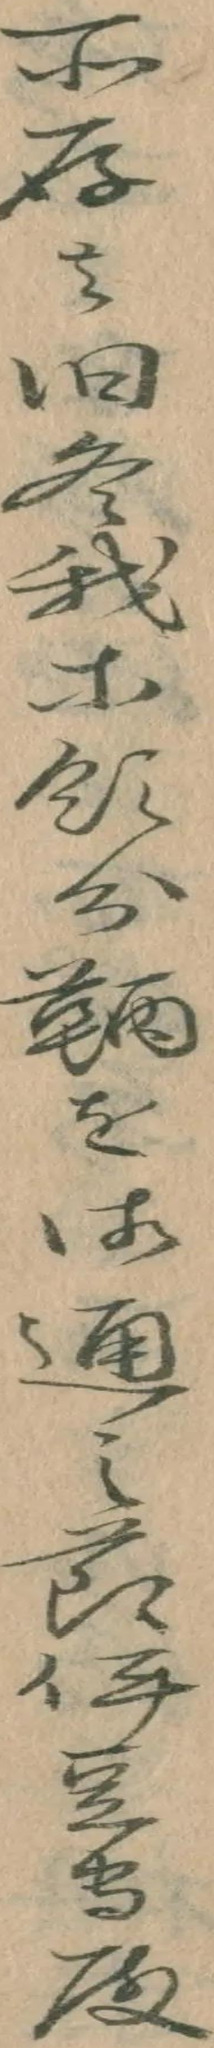所存者旧冬我等領分鞆を御通之節伊豆守殿
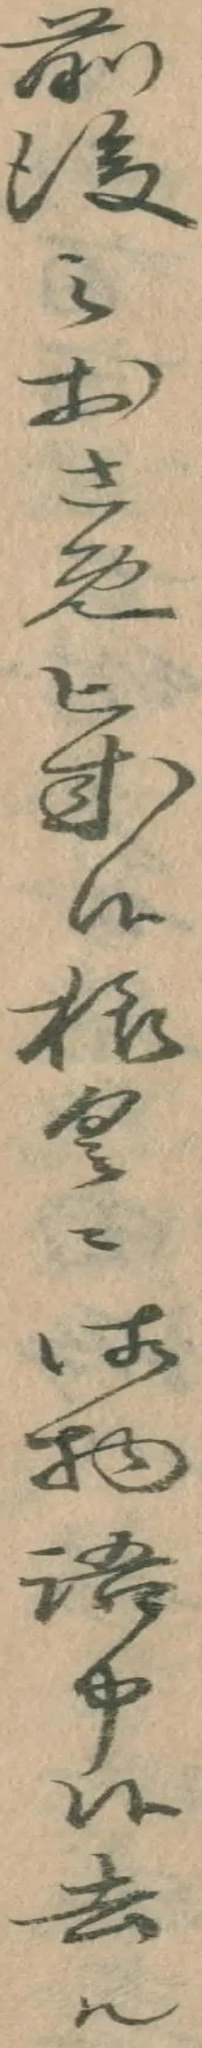前後之おさ免被成候様具に御物語申候去る
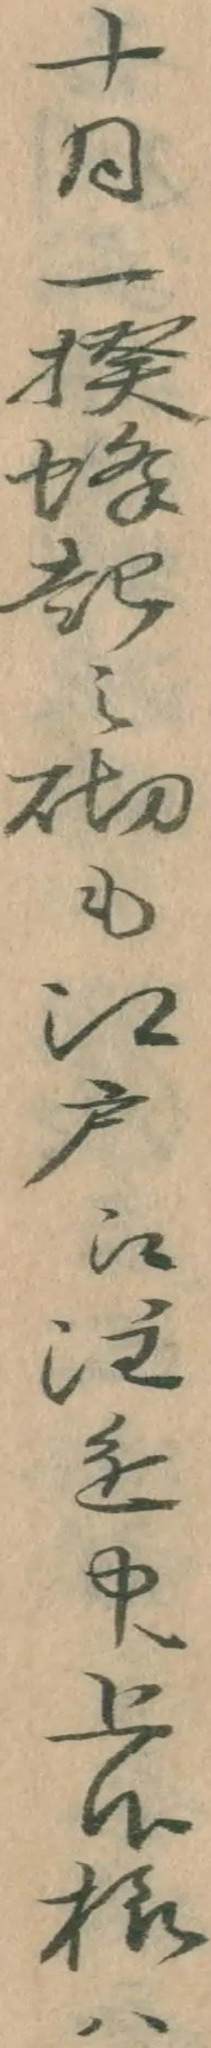十月一揆蜂起之砌も江戸江注進申上候様は

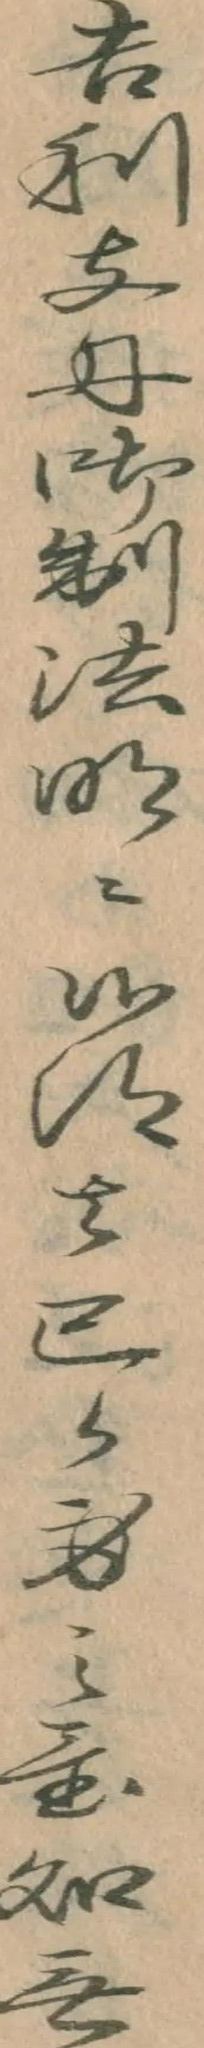吉利支丹御制法明に候得者已か身之置処無
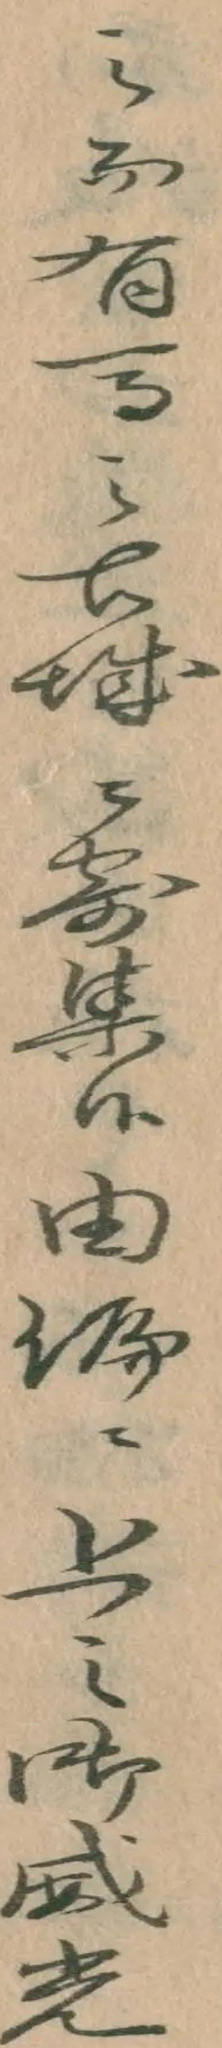之而有馬之古城に寄集候由偏に上之御威光
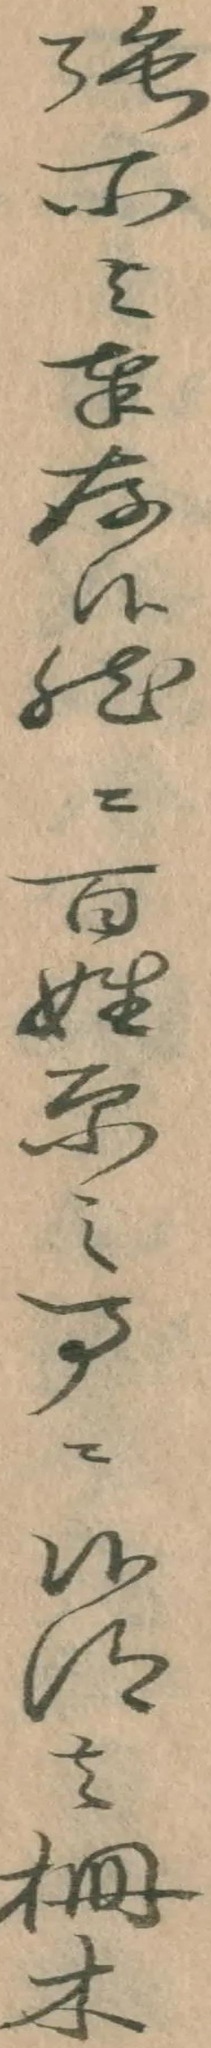強所与奉存候然に百姓原之事に候得者柵木
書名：切支丹御退治記 49巻. [7]
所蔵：国立国会図書館 National Diet Library, JAPAN
